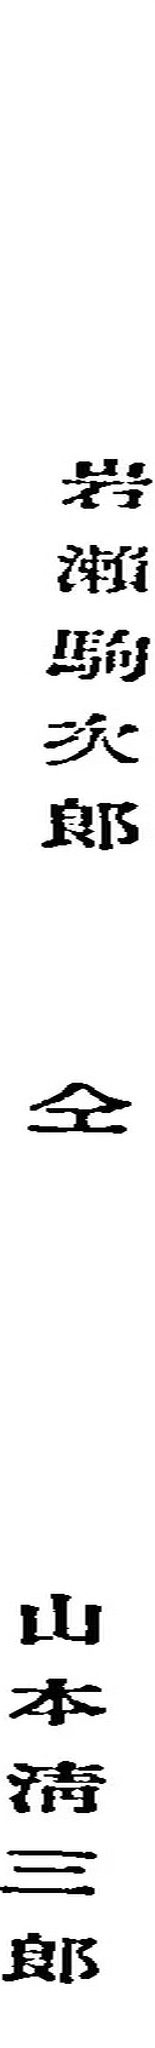仝岩瀬駒次郞仝山本淸三郞
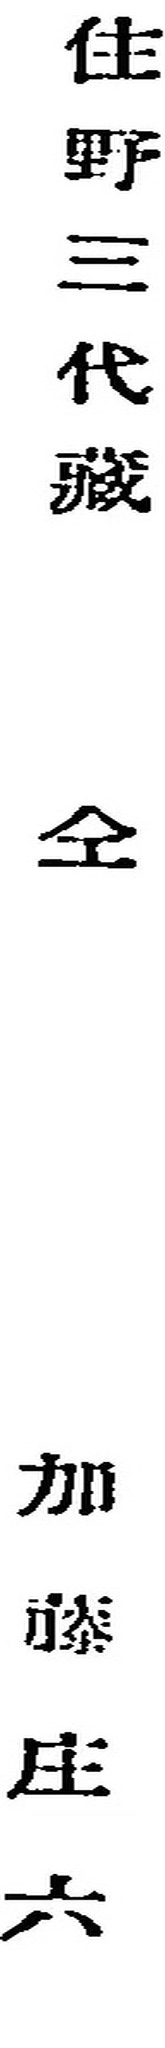仝住野三代藏仝加藤庄六
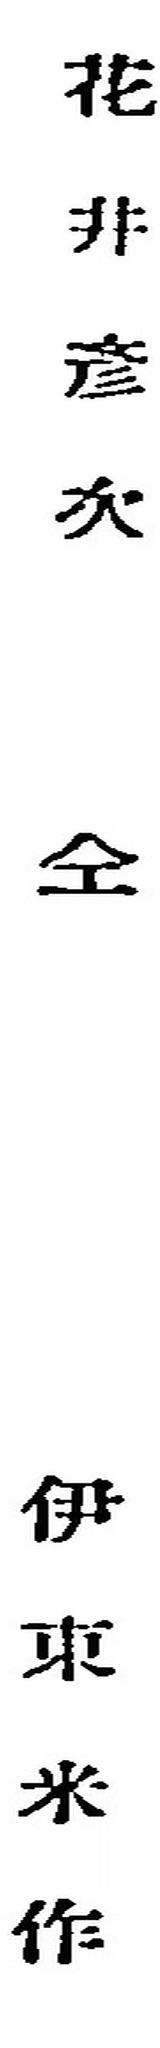仝花井彦次仝伊東米作
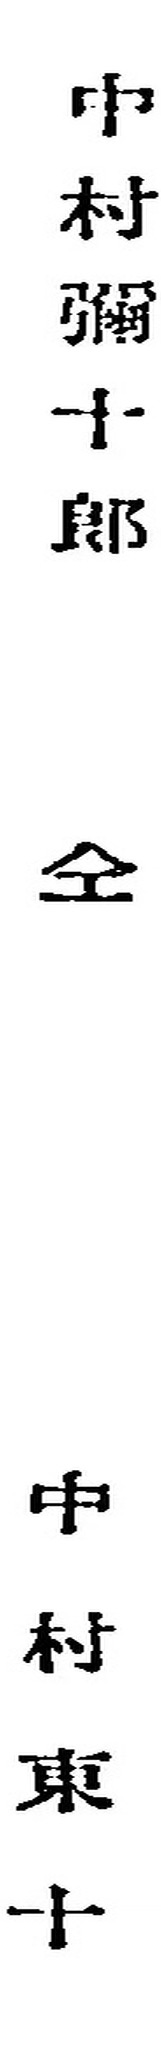仝中村彌十郞仝中村東十
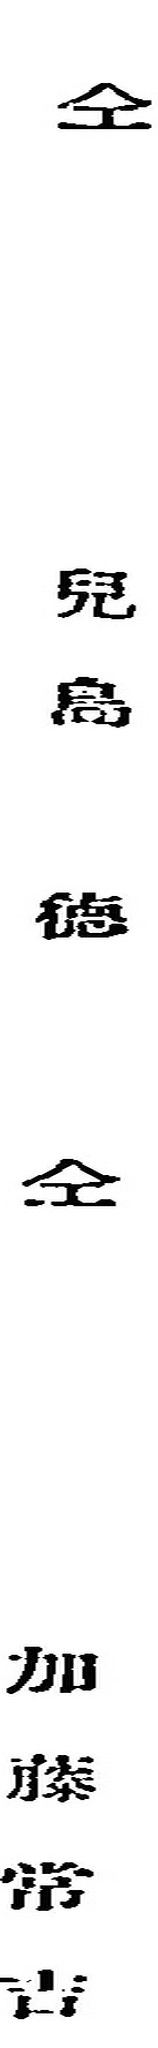仝兒島德仝加藤常吉
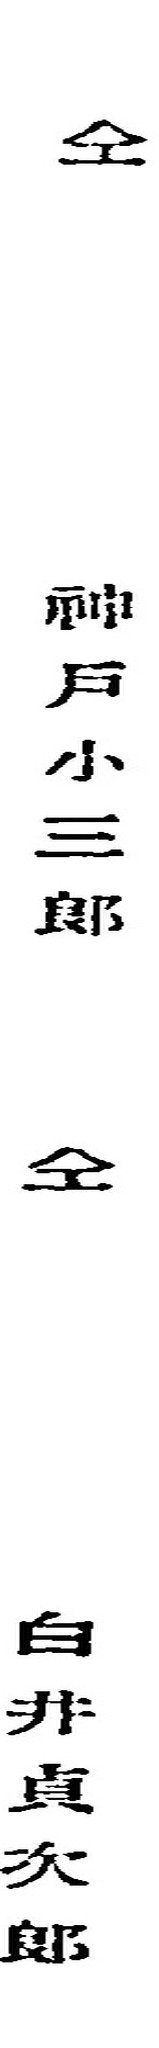仝神戸小三郞仝白井貞次郞
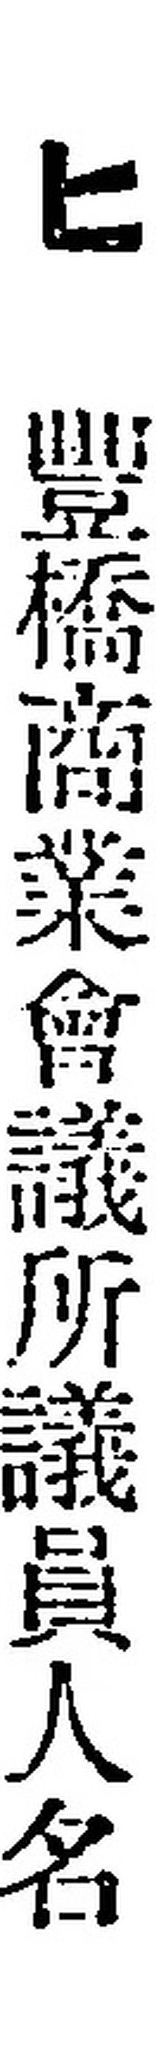ヒ豐橋商業會議所議員人名
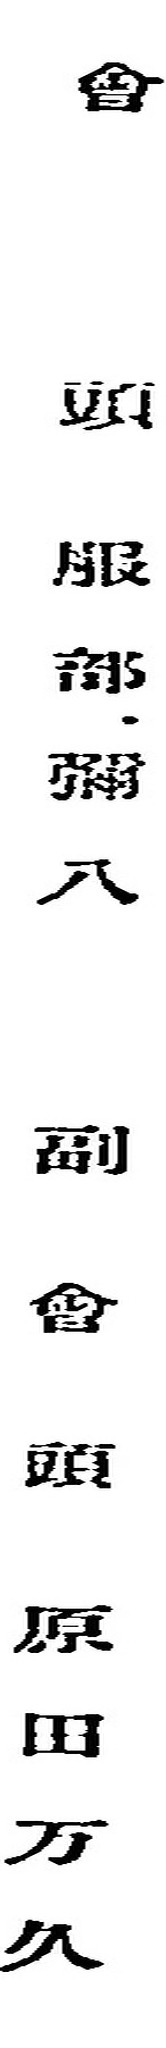會頭服部彌八副會頭原田万久
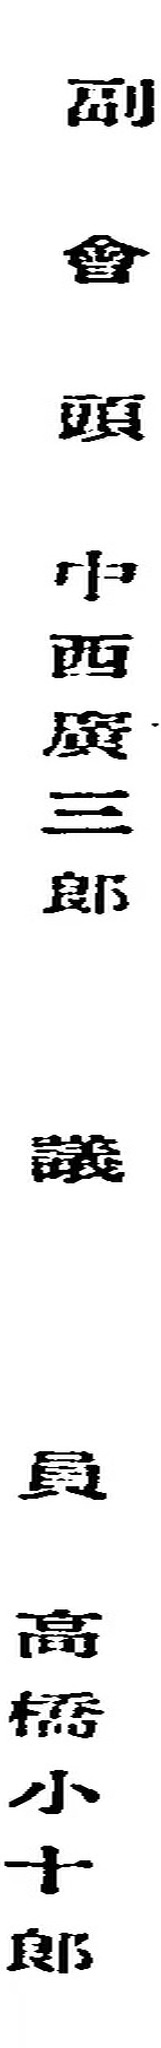副會頭中西廣三郞議員高橋小十郞
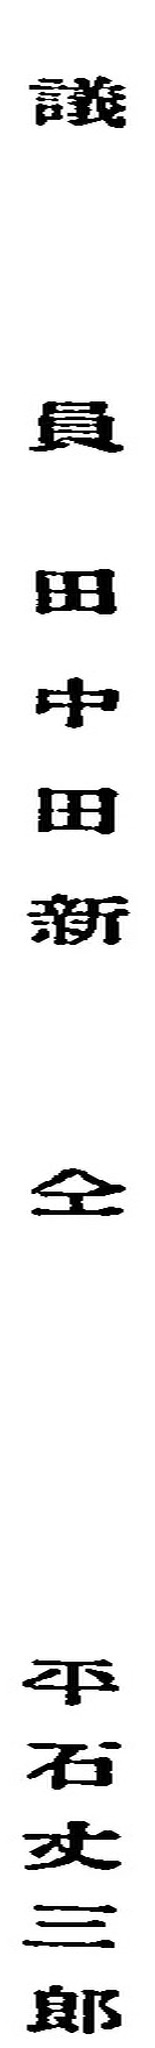議員田中田新仝平石丈三郞
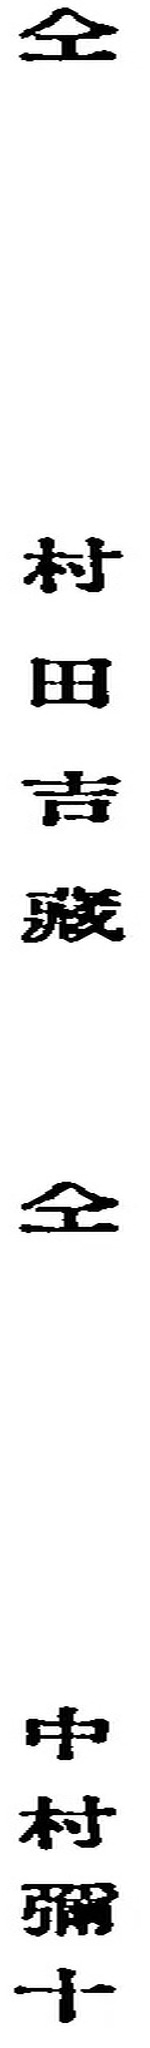仝村田吉藏仝中村彌十郞
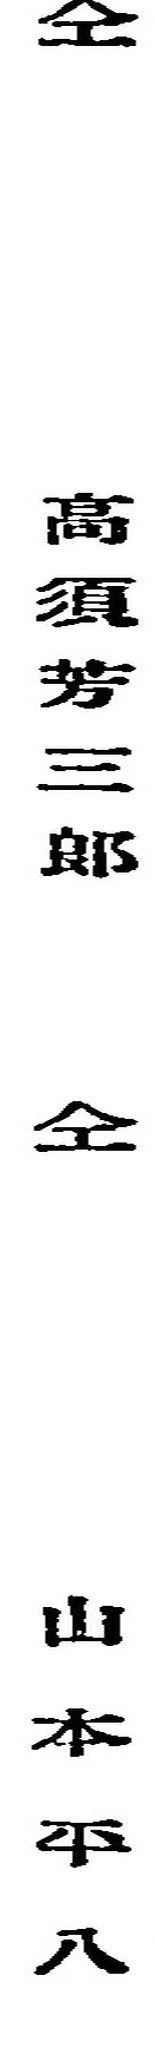仝高須芳三郞仝山本平八
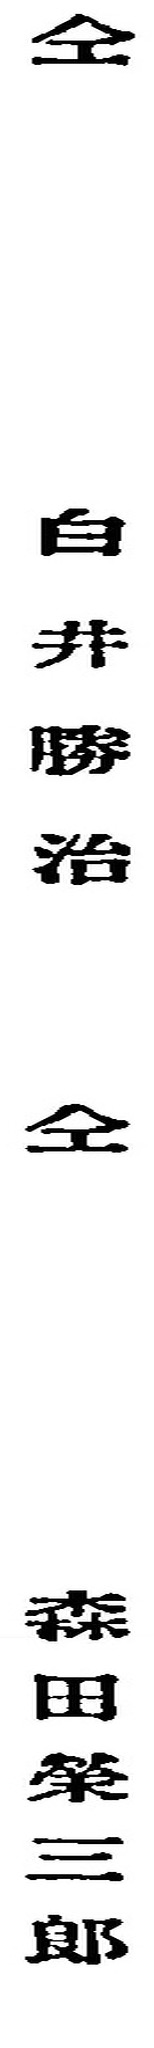仝白井勝治仝森田榮三郞
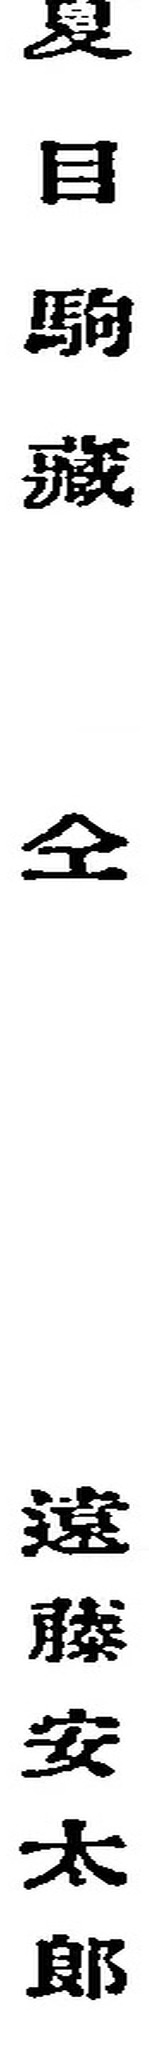仝夏目駒藏仝遠藤安太郞
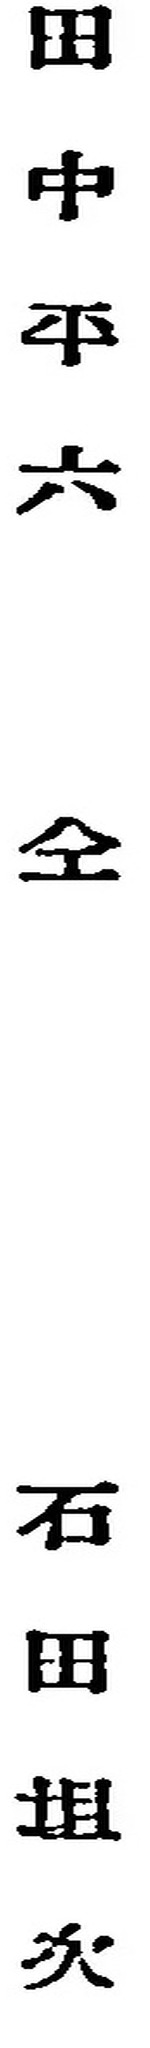仝田中平六仝石田坦次
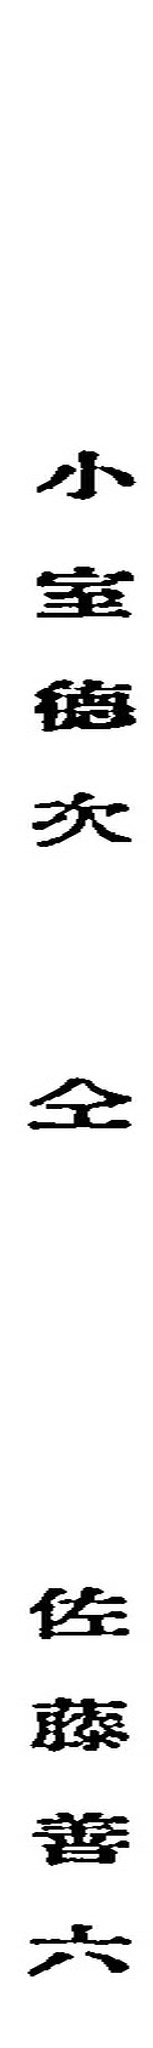仝小室德次仝佐藤善六
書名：豊橋志要
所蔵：国立国会図書館 National Diet Library, JAPAN
